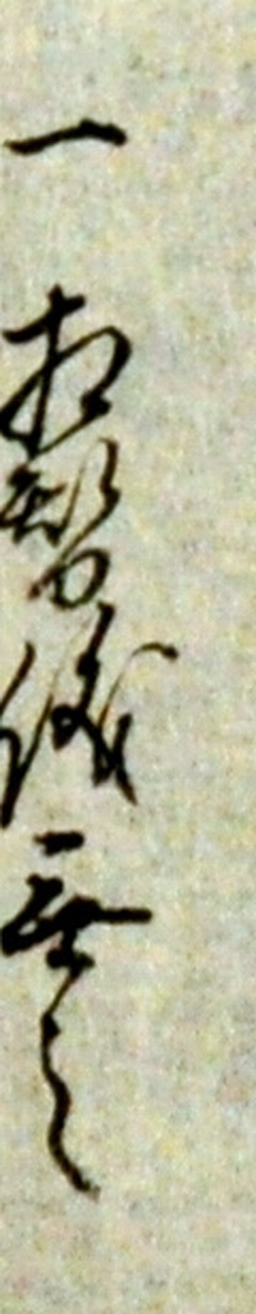一相替儀無之

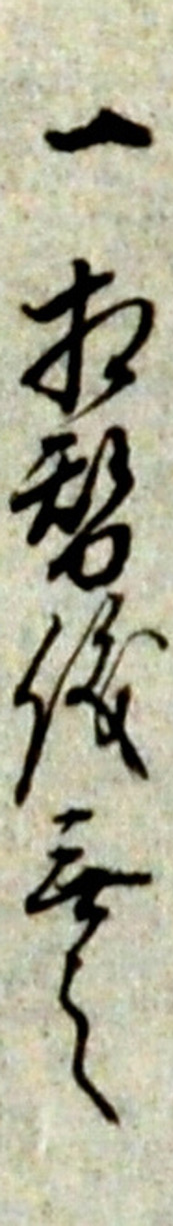一相替儀無之
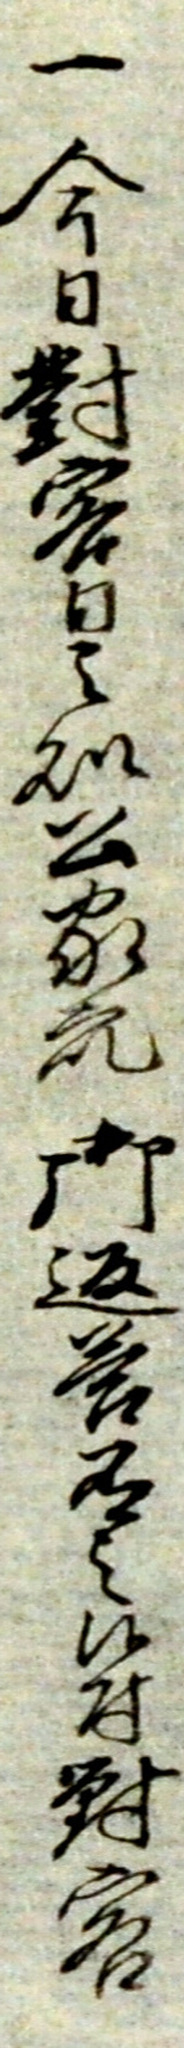一今日対客日之処公家衆御返答有之候付対客
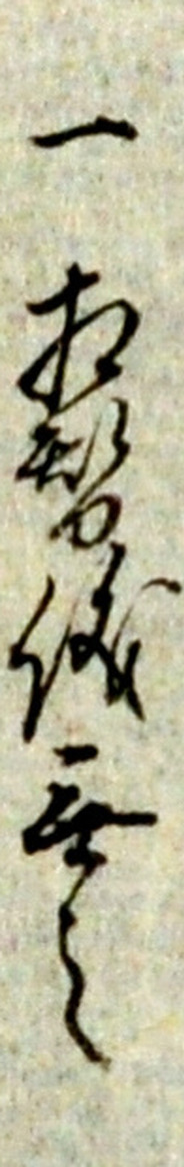一相替儀無之
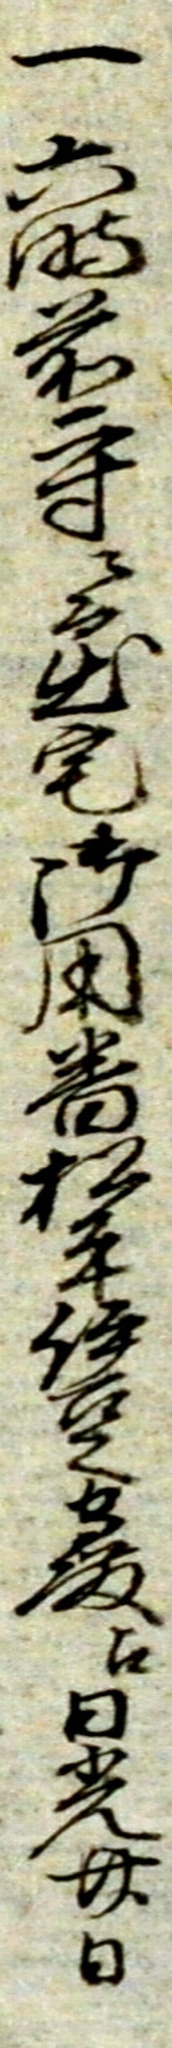一六時前二寸二而出宅御用番松平伊豆守殿江日光廿日
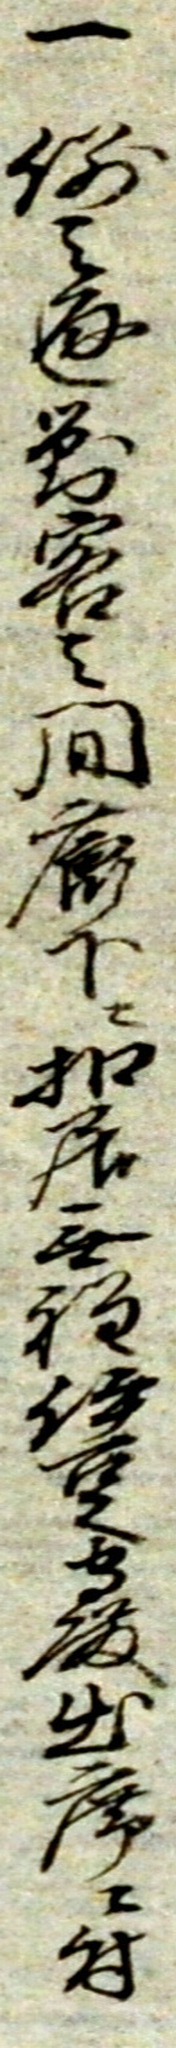一例之通対客之間廊下二扣居無程伊豆守殿出席ニ付
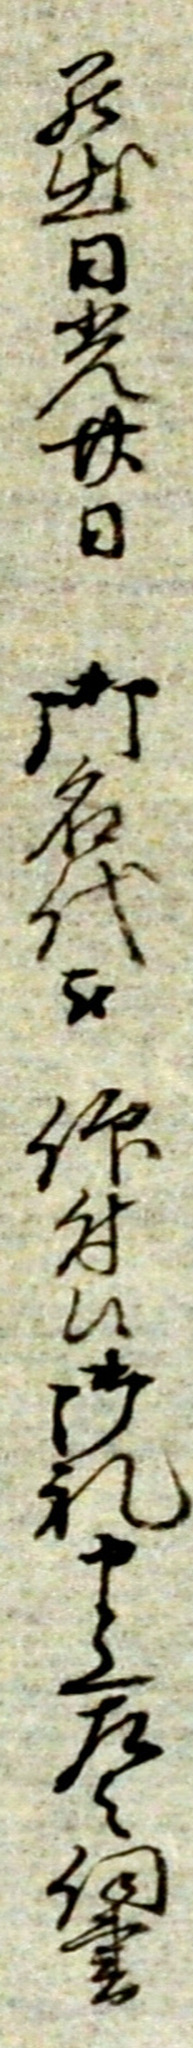罷出日光廿日御名代被仰付候御礼申上左之伺書
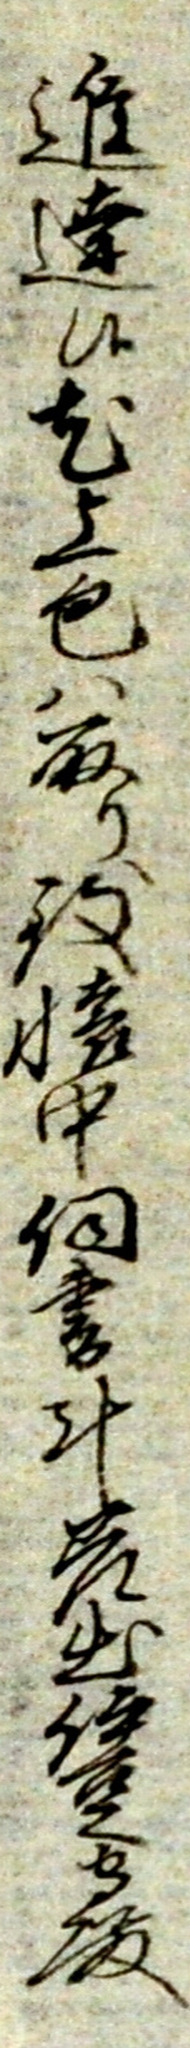進達候尤上包ハ取り致懐中伺書計差出伊豆守殿
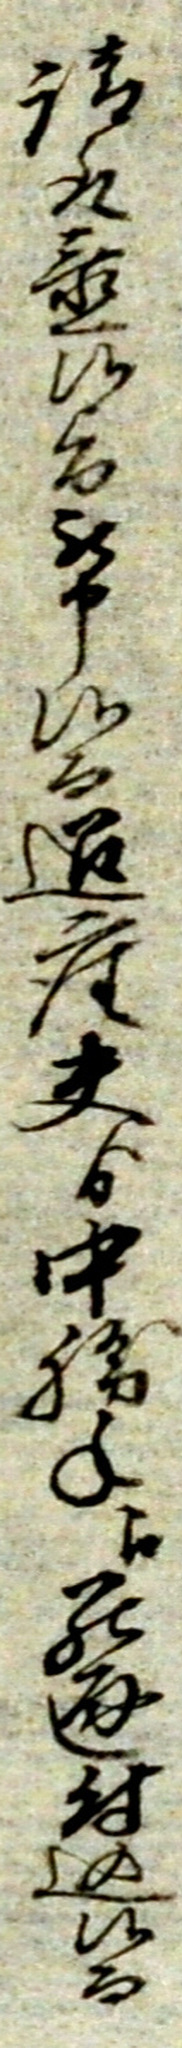請取置候旨被申候而退座夫ゟ中勝手江罷通付込候而
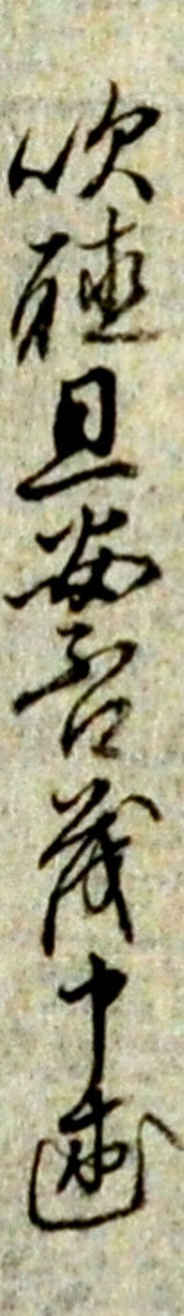吹聴且安否も申述
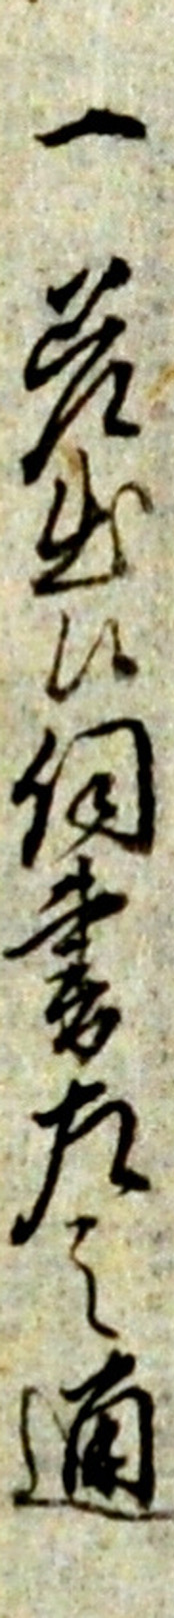一差出候伺書左之通
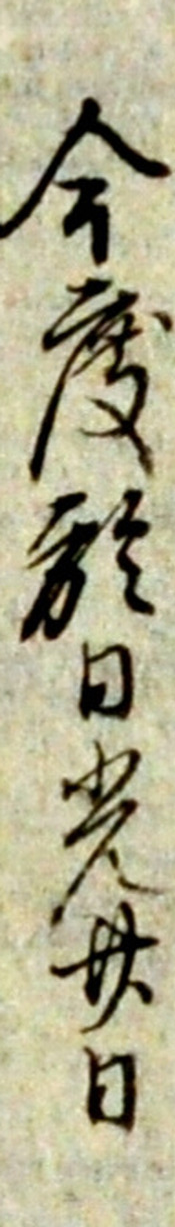今度於日光廿日
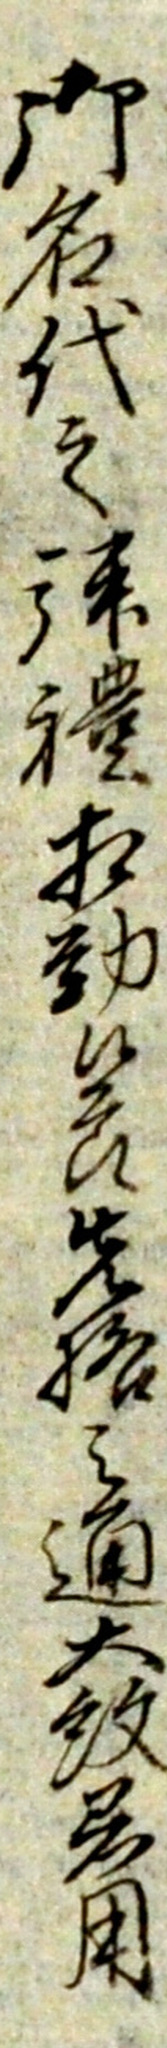御名代之拝礼相勤候節先格之通大紋着用
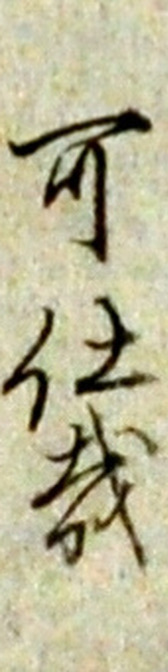可仕哉
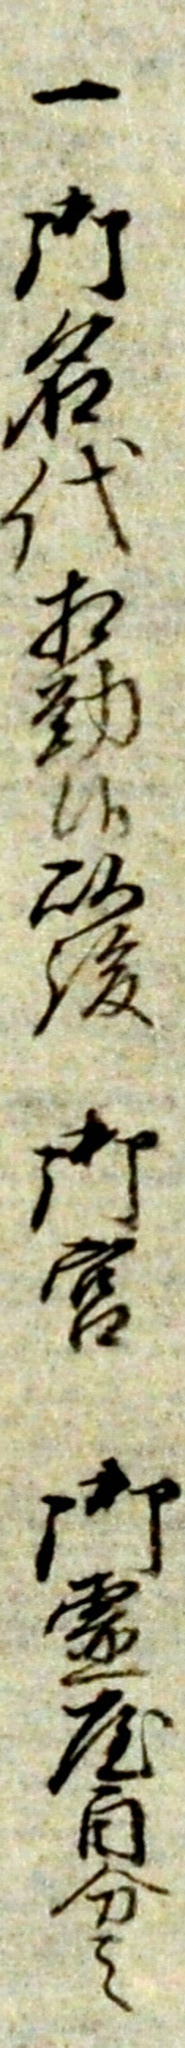一御名代相勤候以後御宮御霊屋自分之
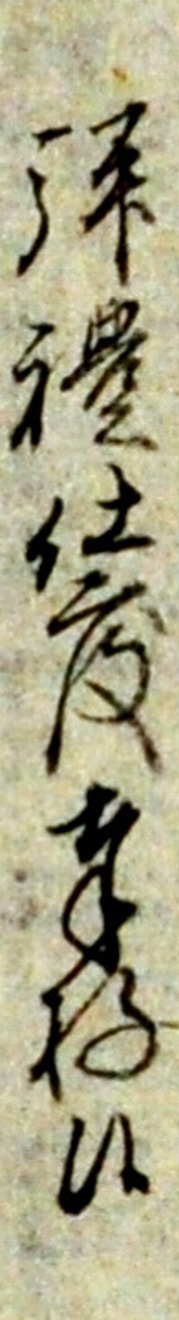拝礼仕度奉存候
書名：日光御名代相勤候節ノ留
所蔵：伊那市立高遠町図書館・合同会社AMANE
